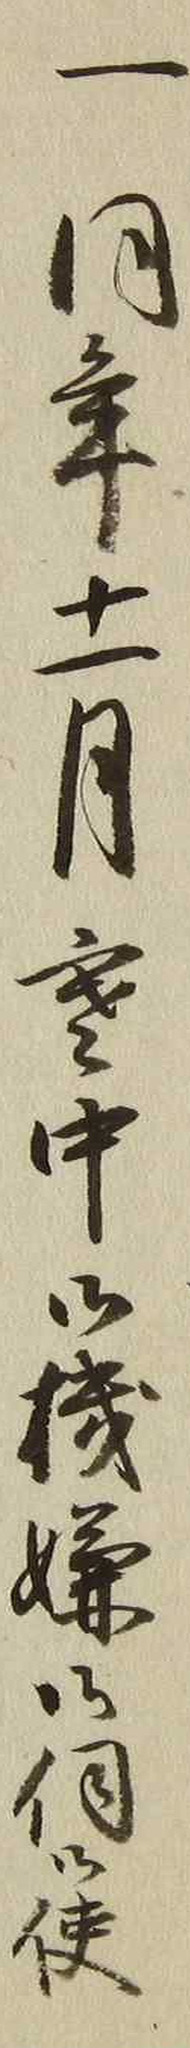一同年十一月寒中御機嫌御伺御使
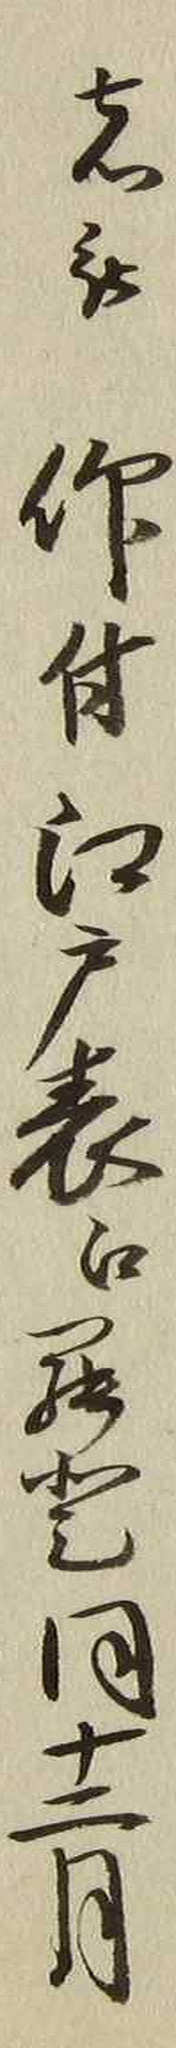者被仰付江戸表江罷登同十二月
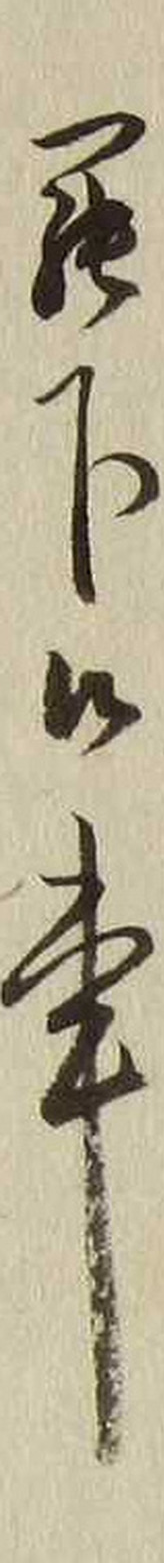罷下候事
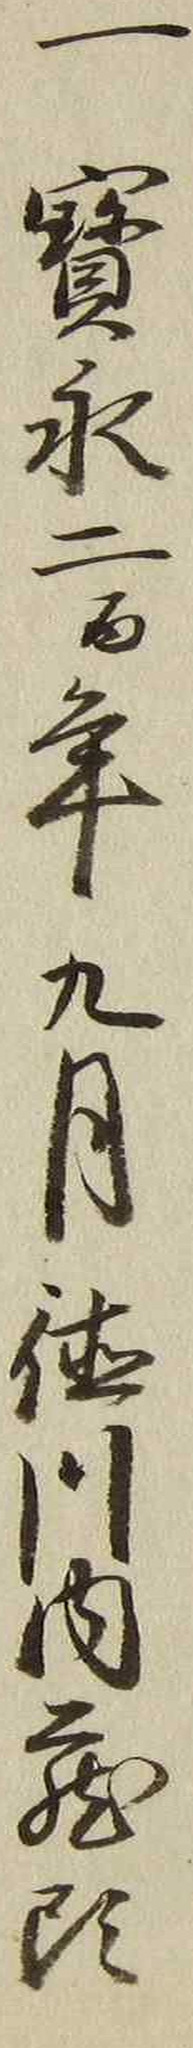一宝永二酉年九月徳川内蔵頭
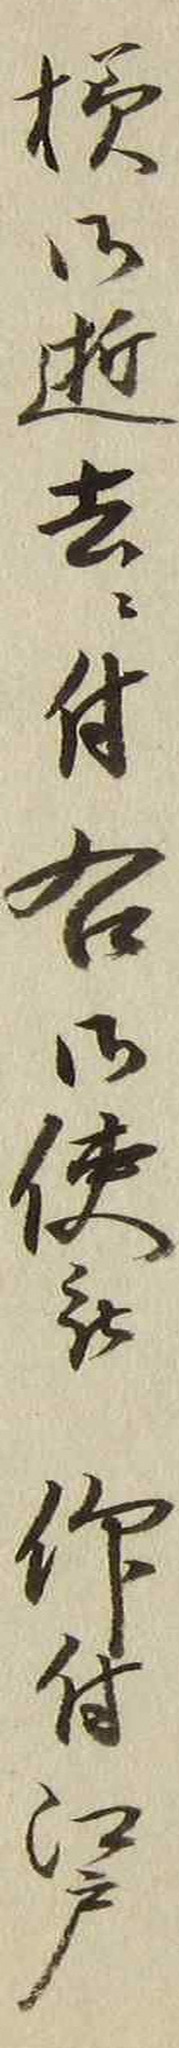様御逝去に付右御使被仰付江戸
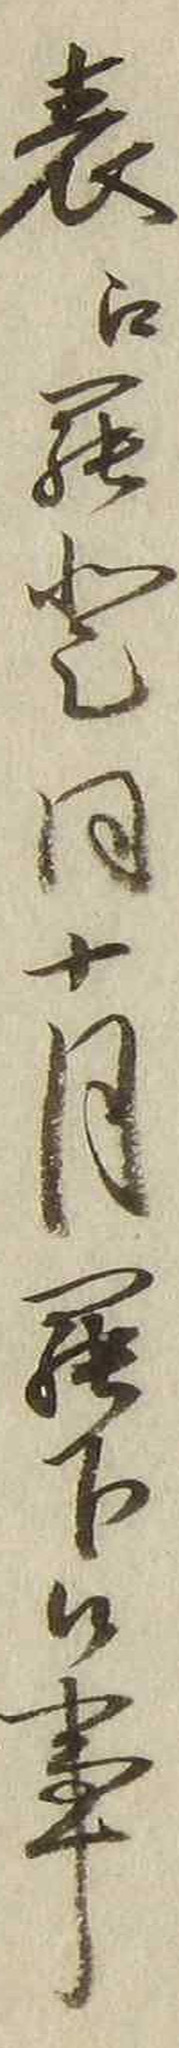表江罷登同十月罷下候事
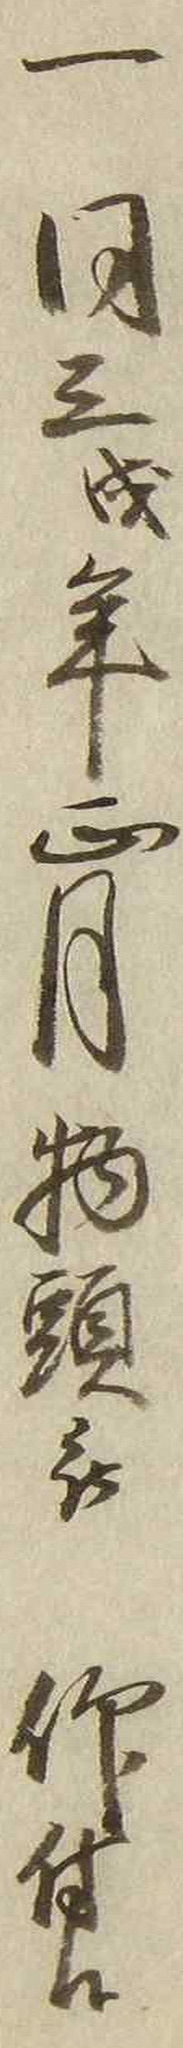一同三戌年正月物頭被仰付候

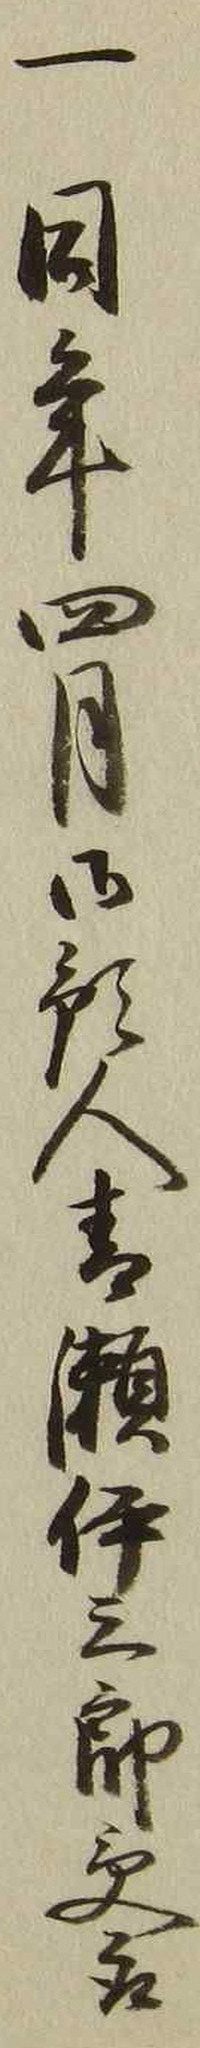一同年四月御預人青瀬伊三郎受取
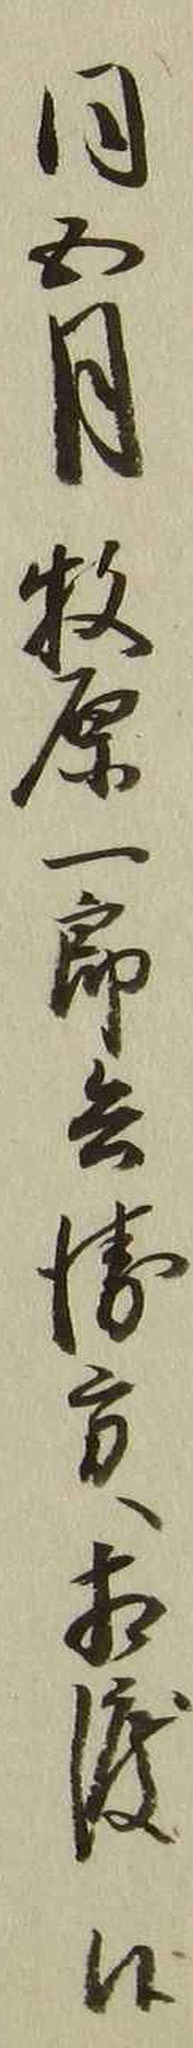同五月牧原一郎兵衛方へ相渡候
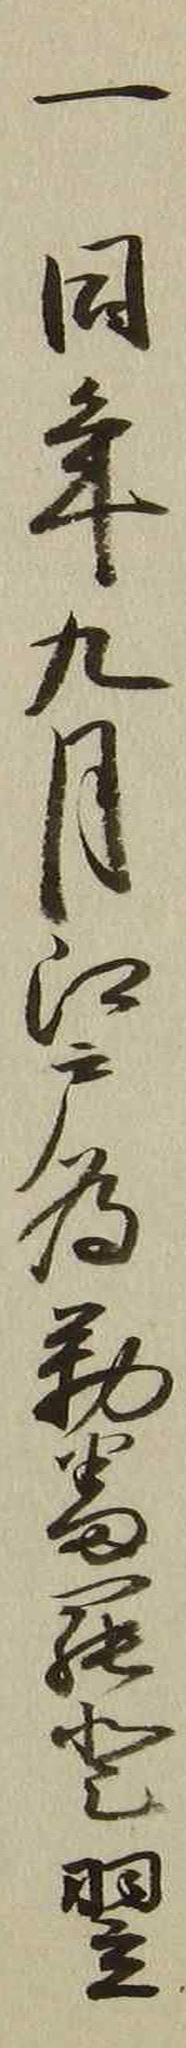一同年九月江戸為勤番罷登翌
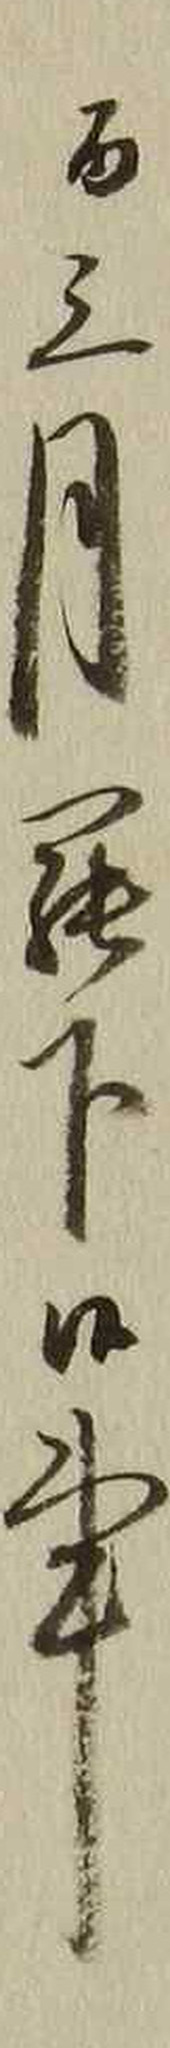酉三月罷下候事
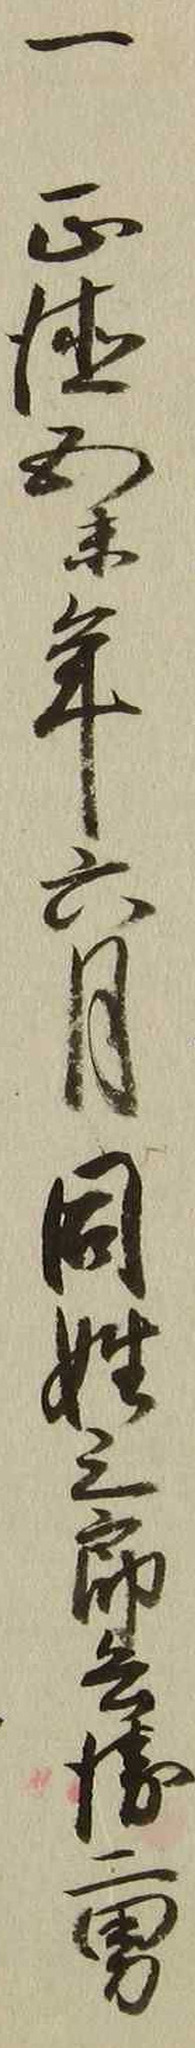一正徳五未年六月同姓三郎兵衛二男
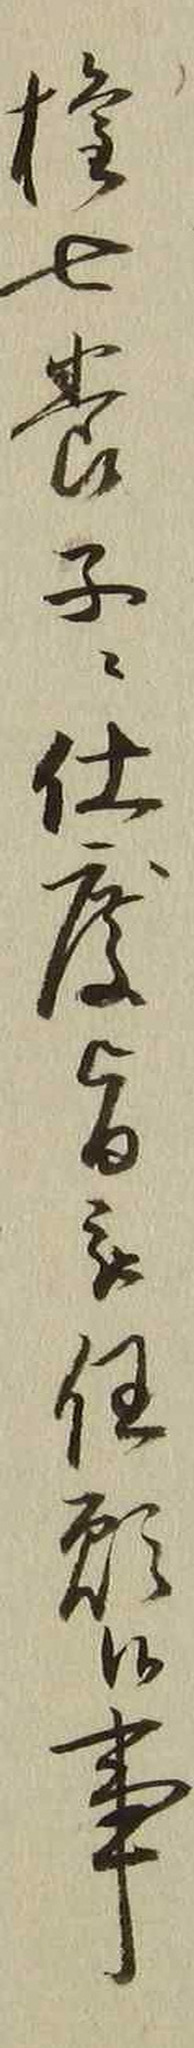権七養子に仕度旨被任願候事
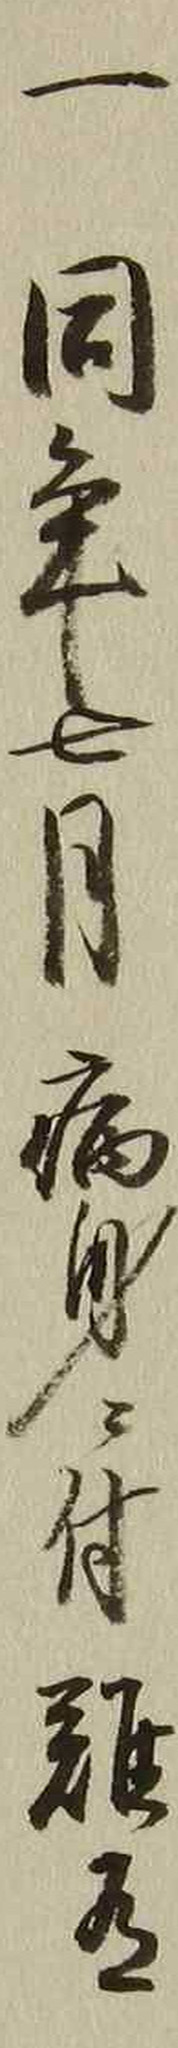一同年七月病身に付難有
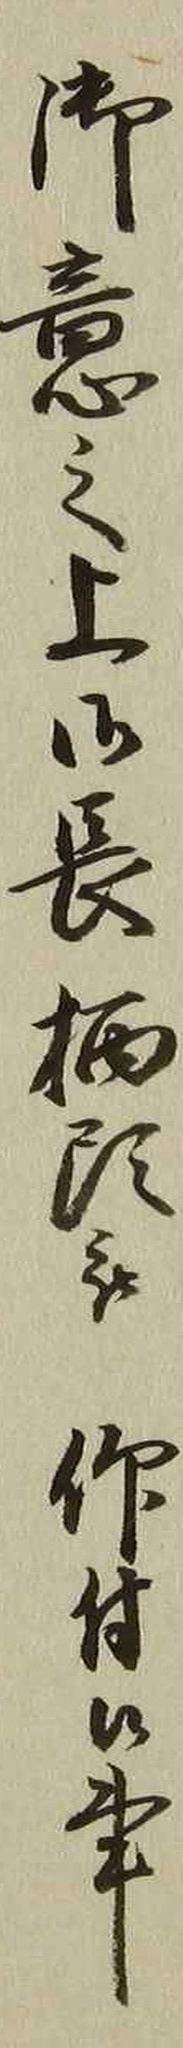御意之上御長頭被仰付候事
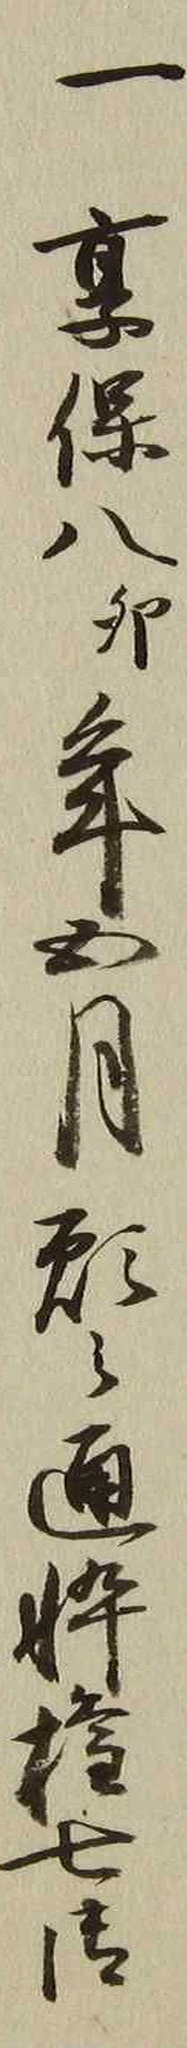一享保八卯年五月願之通忰権七御
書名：諸士系譜　巻之133　た之部9
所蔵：会津若松市立会津図書館
